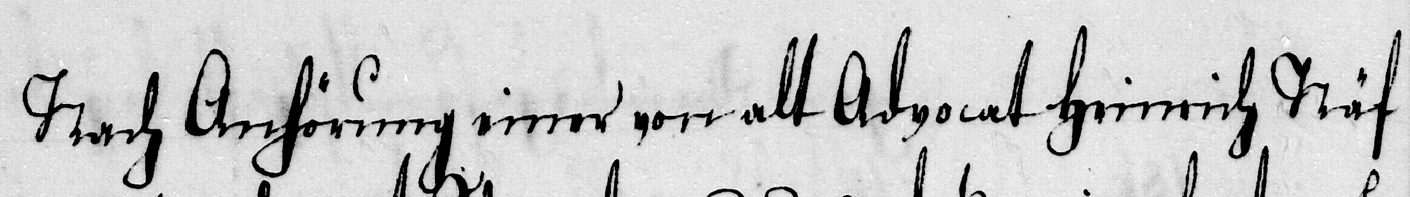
Nach Anhörung einer von alt Advocat Heinrich Näf
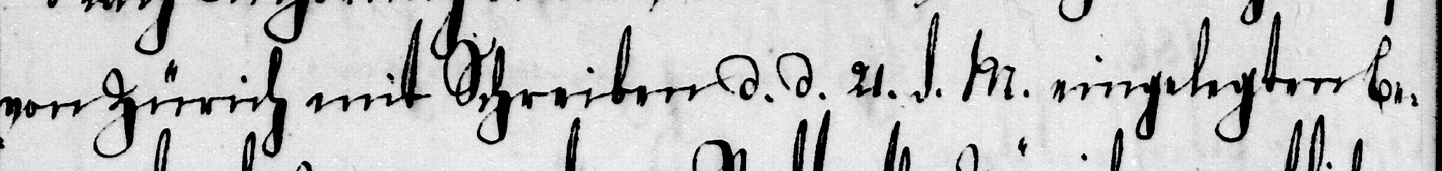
von Zürich mit Schreiben d. d. 21. d. M. eingelegten Be¬
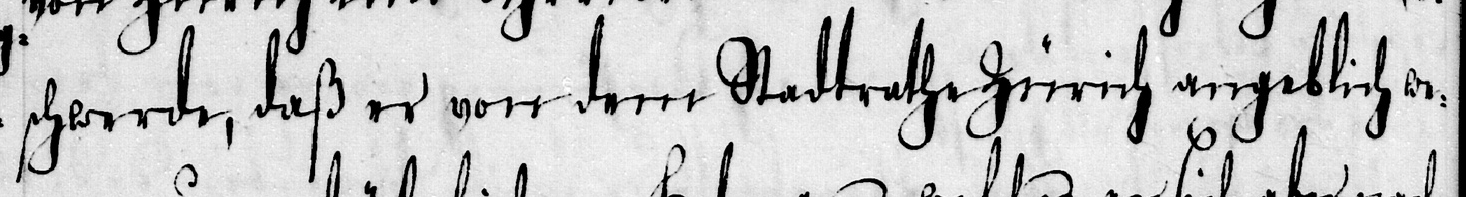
schwerde, daß er von dem Stadtrathe Zürich angeblich w¬
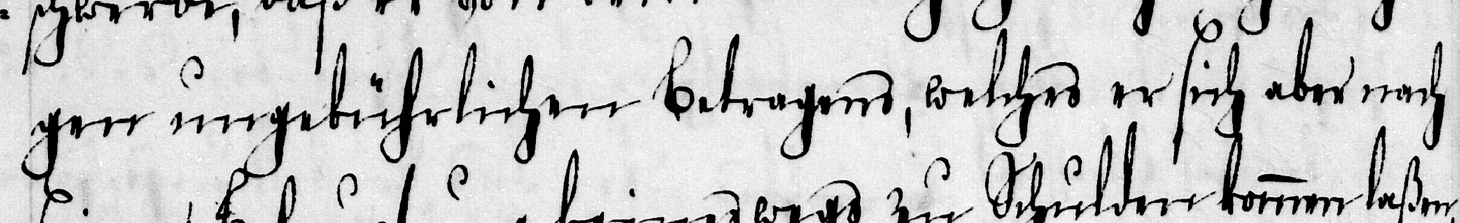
egen ungebührlichen Betragens, welches er sich aber nach
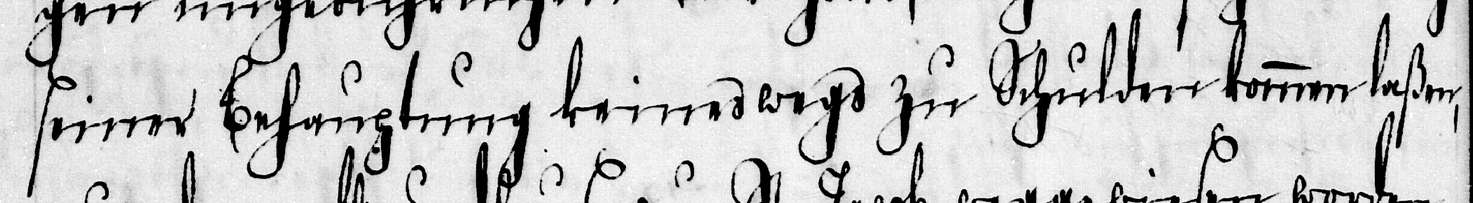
seiner Behauptung keineswegs zu Schulden kommen laße¬
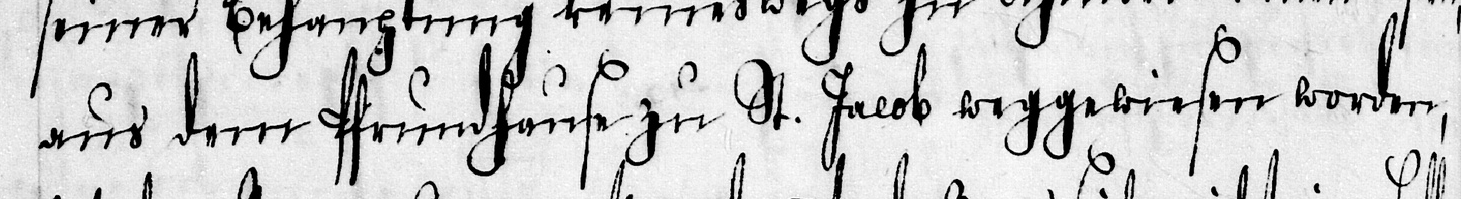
aus dem Pfrundhause zu St. Jacob weggewiesen worden,
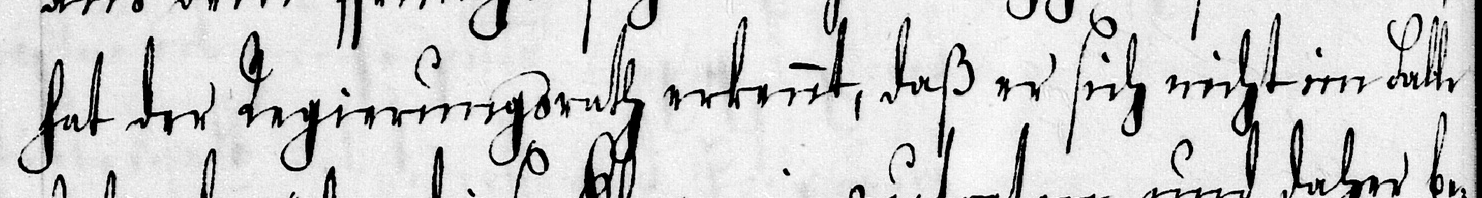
hat der Regierungsrath erkennt, daß er sich nicht im Fal¬
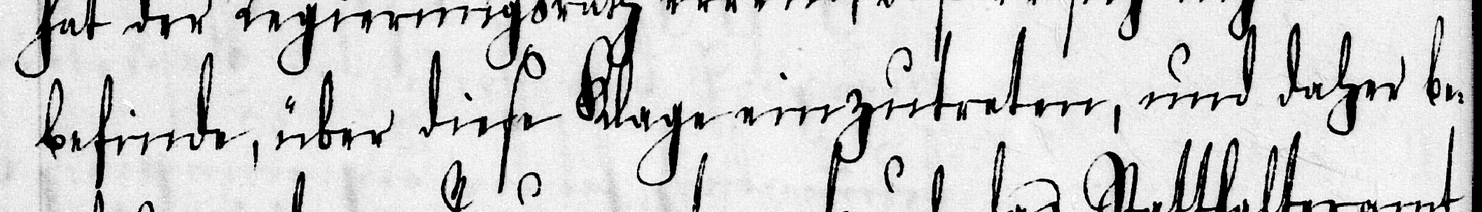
befinde, über diese Klage einzutreten, und daher be¬
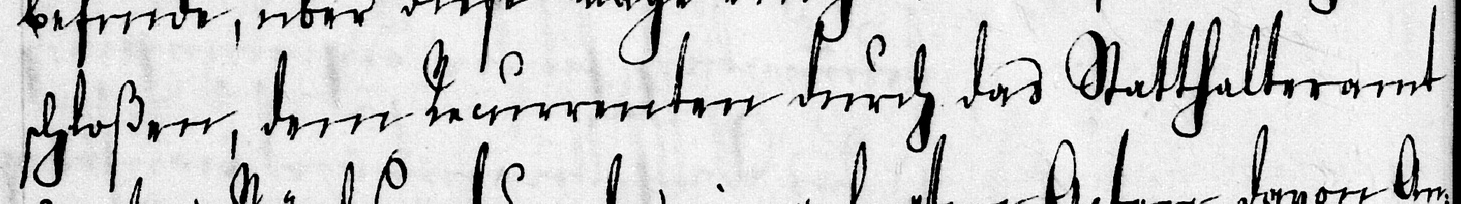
schloßen, dem Recurrenten durch das Statthalteramt
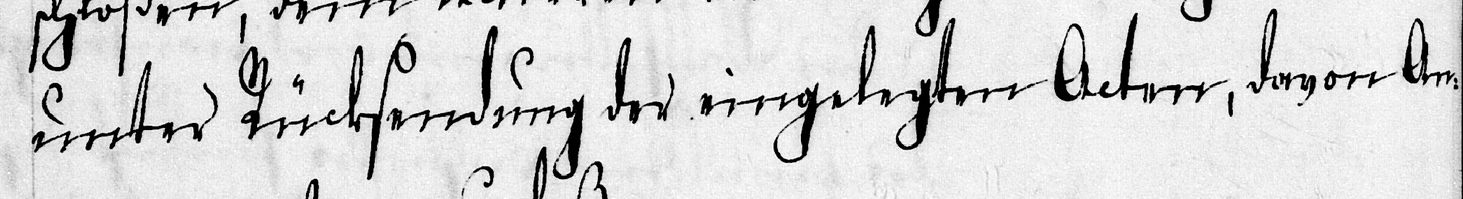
unter Rücksendung der eingelegten Acten, davon An¬
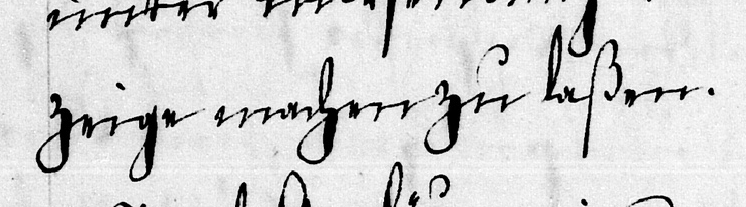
zeige machen zu laßen.
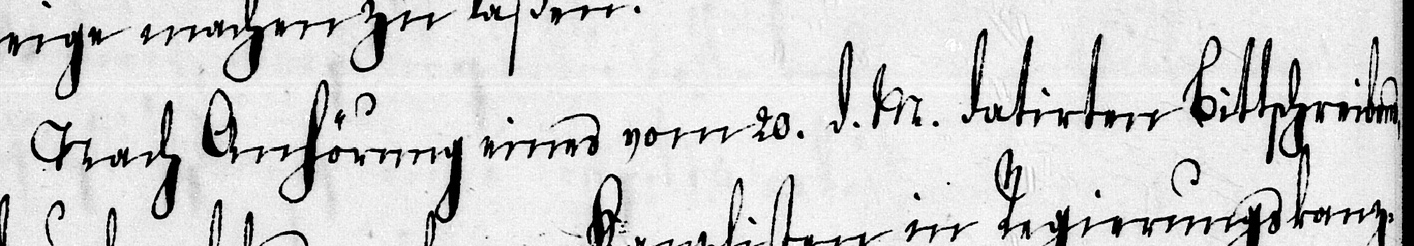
Nach Anhörung eines vom 20. d. M. datirten Bittschreib¬
